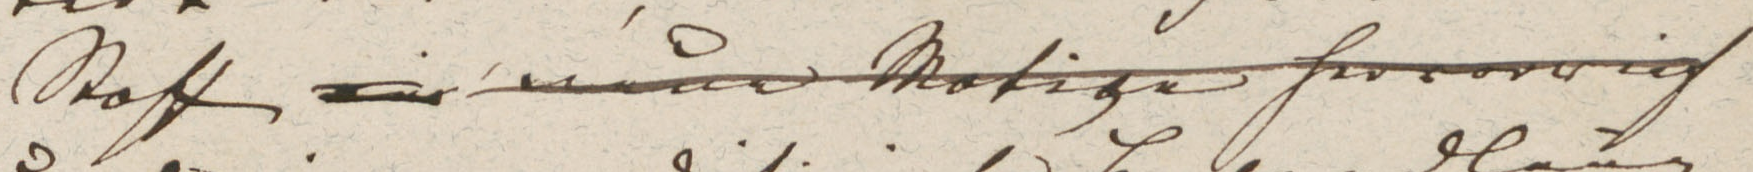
Stoff neue Motive hervorrief
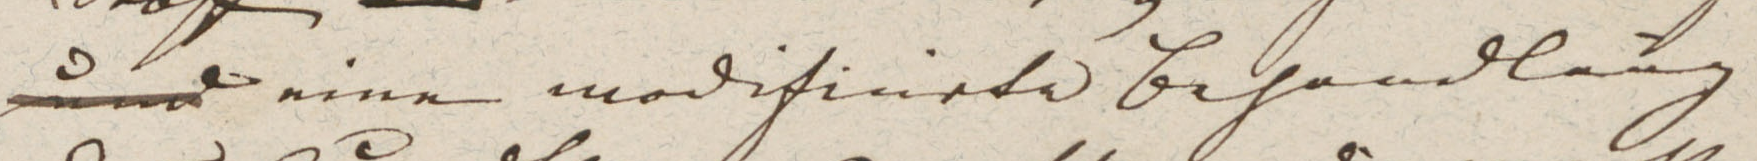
und eine modificirte Behandlung
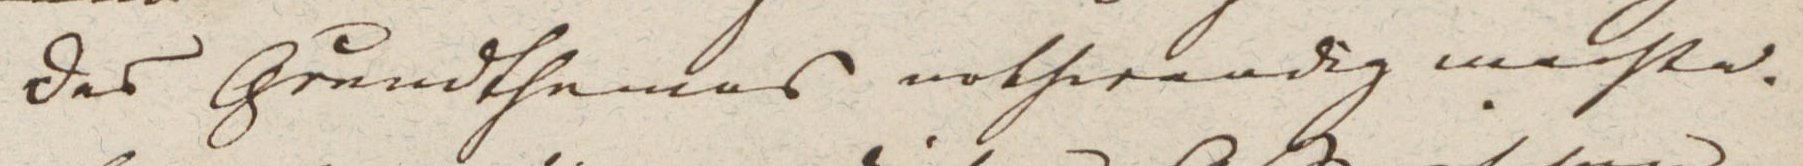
des Grundthemas nothwendig machte.
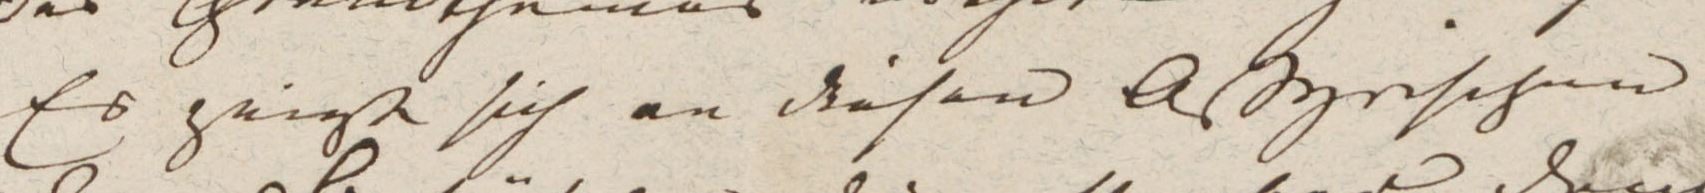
Es zeigt sich an diesen Assyrischen
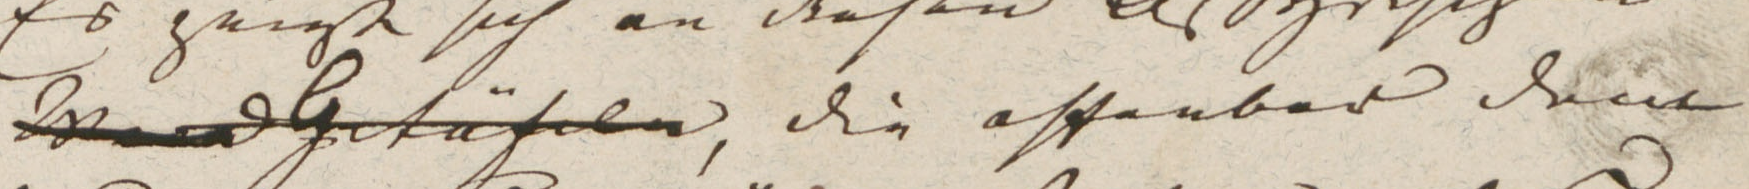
Wand Getäfeln, die offenbar dem
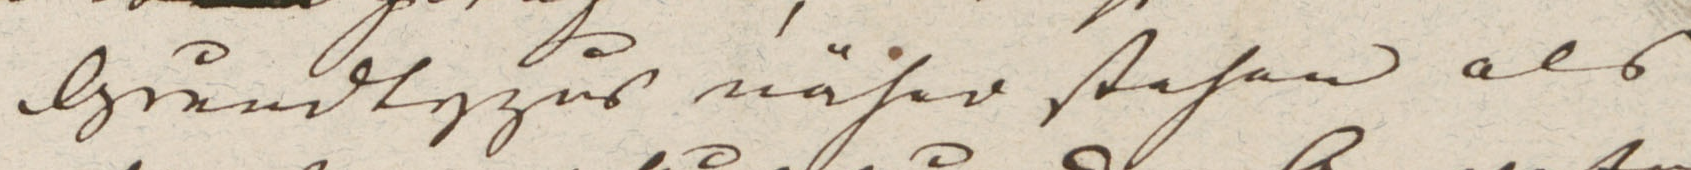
Grundtypus näher stehen als
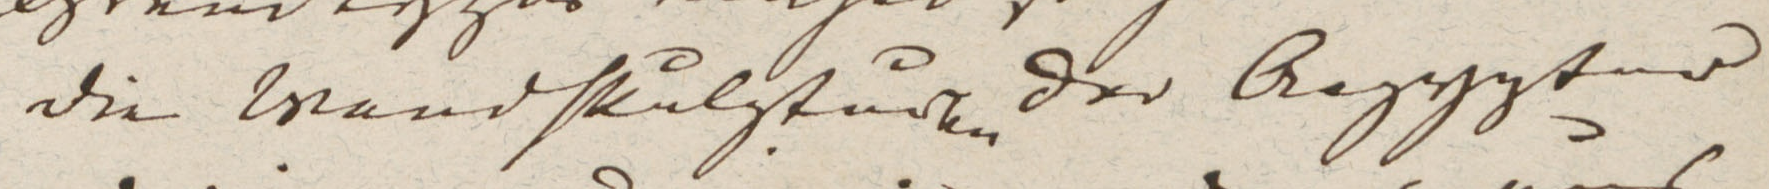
die Wandskulpturen der Aegpter
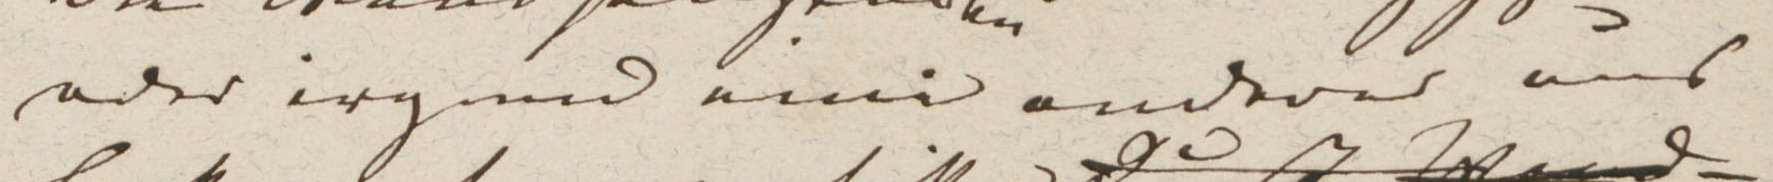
oder irgend eine ander uns
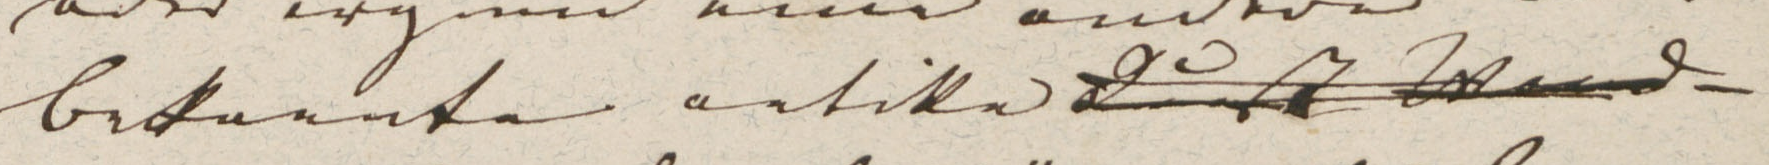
bekannte antike Kunst Wand-
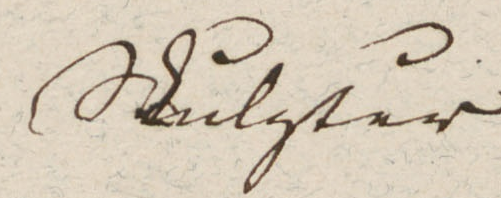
Skulptur
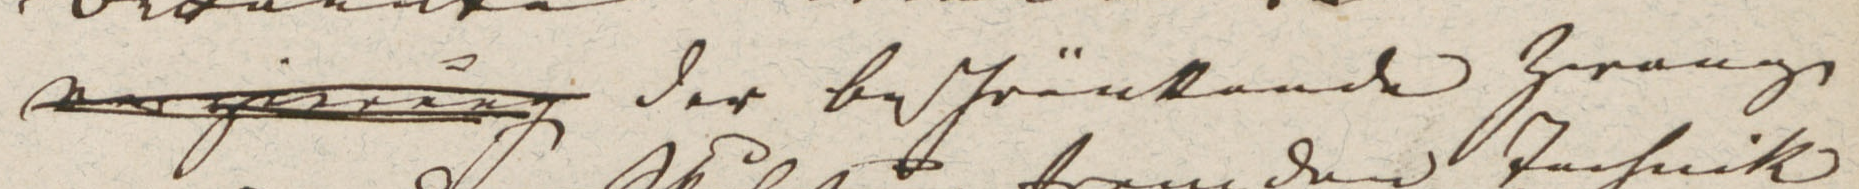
verzierung der beschränkende Zwang
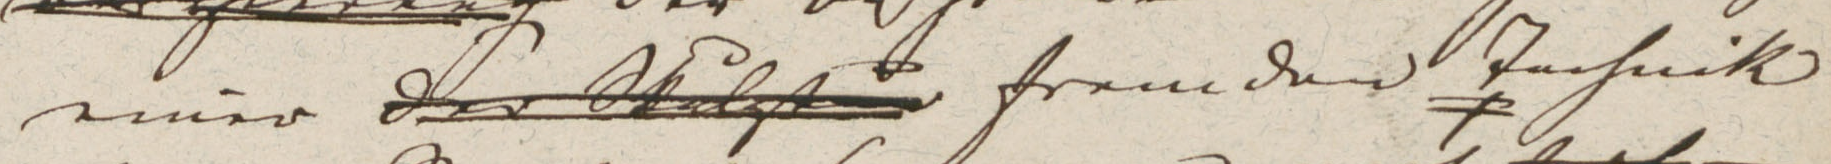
einer der Skulptur fremden Technik
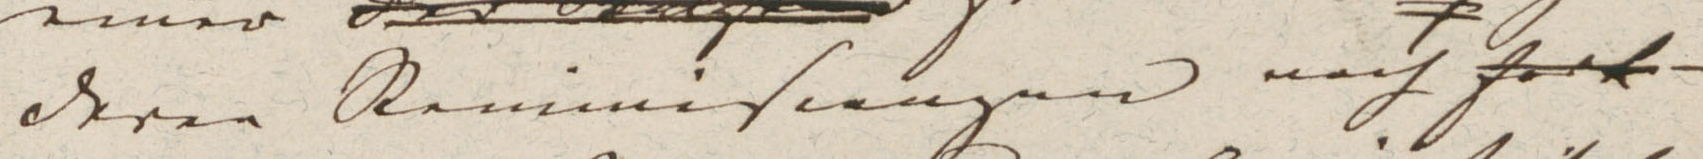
deren Reminiscenzen noch % fort-
